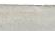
nier en conséquence
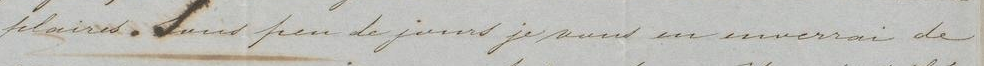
plaires. Sous peu de jours je vous en enverrai de
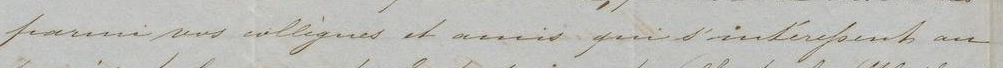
parmi vos collègues et amis qui s'intéressent au
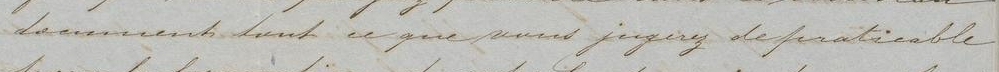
document tant ce que vous jugerez de praticable
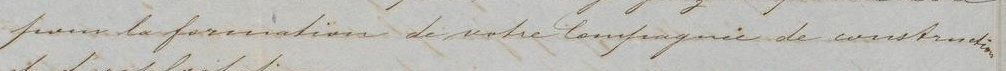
pour la formation de votre Compagnie de construction
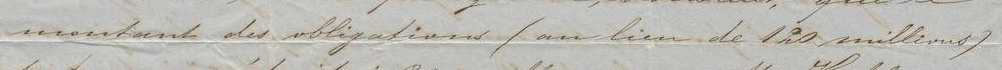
montant des obligations (au lieu de 120 millions)
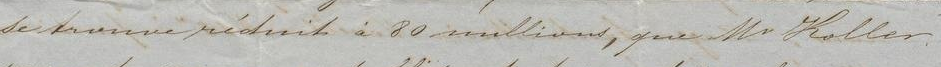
se trouve réduit à 80 millions, que MrKoller,
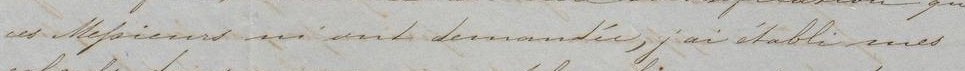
ces Messieurs m'ont demandée, j'ai établi mes
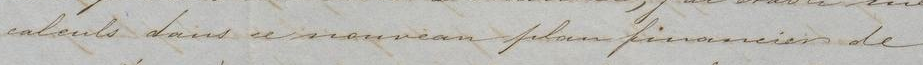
calculs dans ce nouveau plan financier de
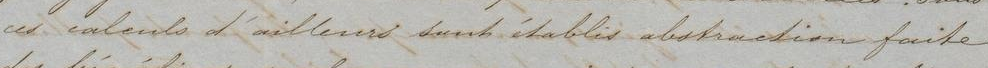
ces calculs d'ailleurs sont établis abstraction faite
